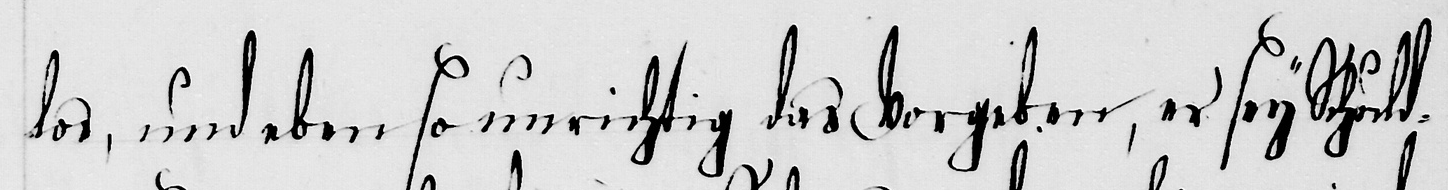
los, und eben so unrichtig das Vorgeben, er sey Schul¬
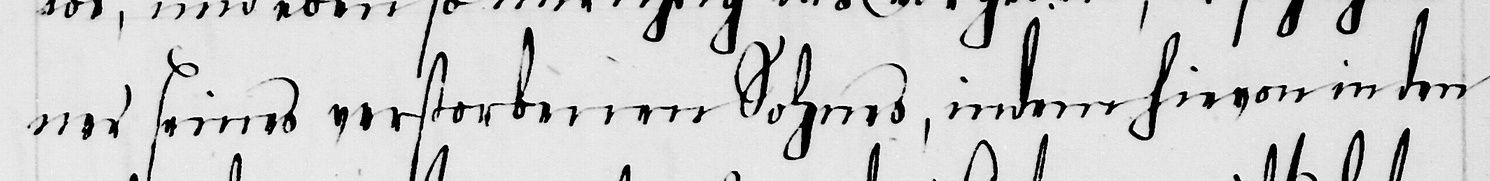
dner seines verstorbenen Sohnes, indem hievon in den
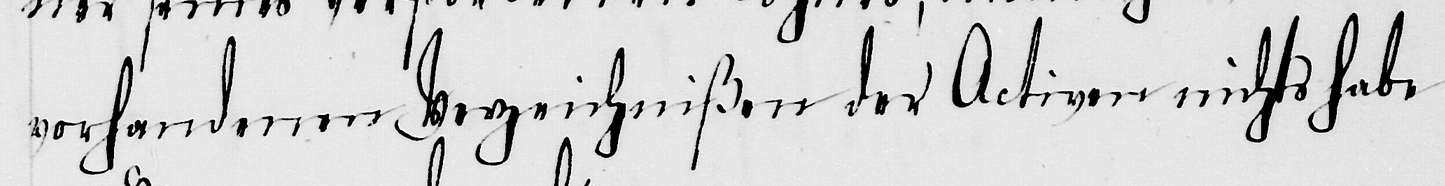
vorhandenen Verzeichnißen der Activen nichts habe
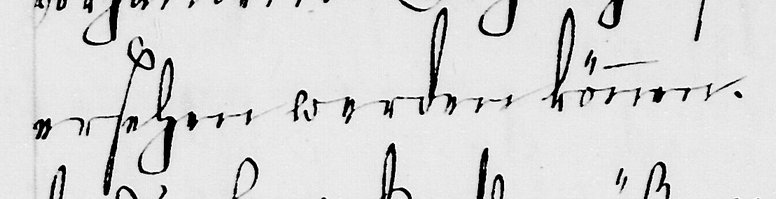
ersehen werden können.
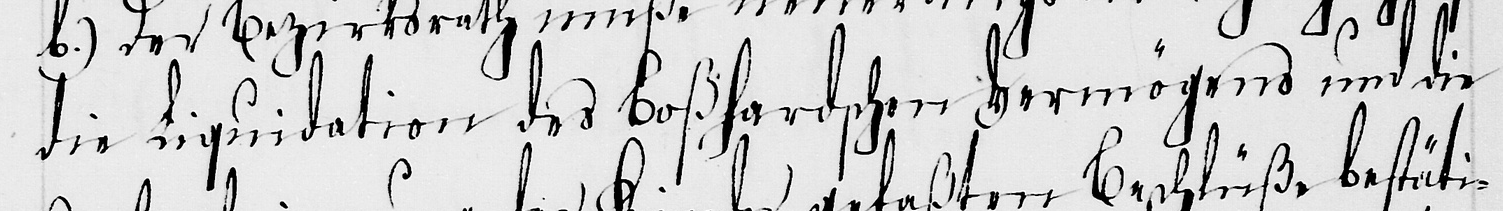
die Liquidation des Boßhardschen Vermögens und die
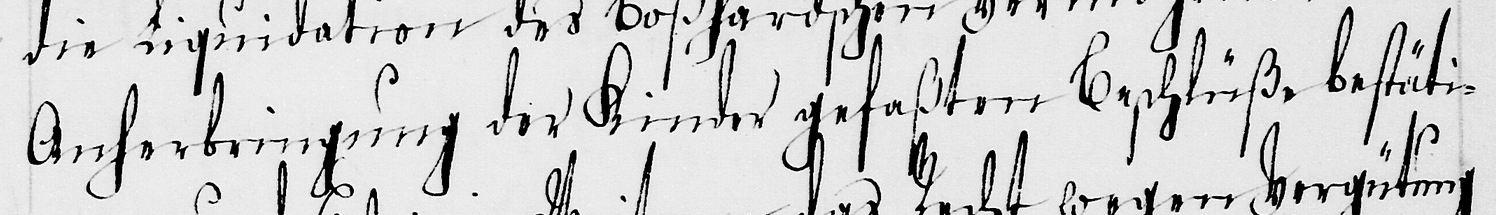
Anherbringung der Kinder gefaßten Beschlüße bestäti¬
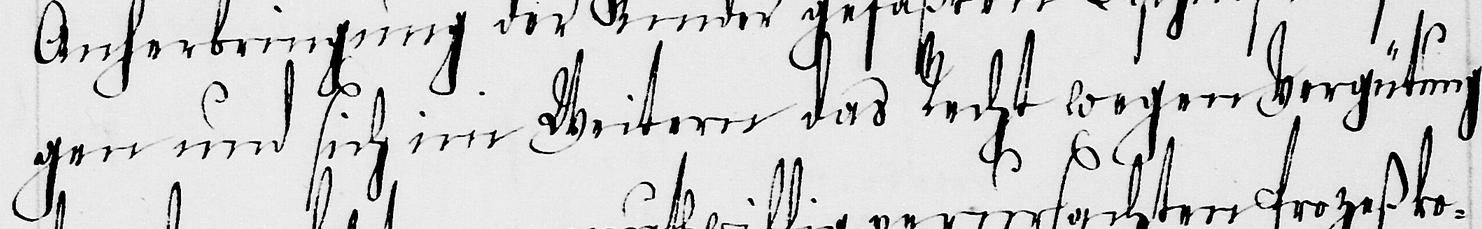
gen und sich im Weitern das Recht wegen Vergütung
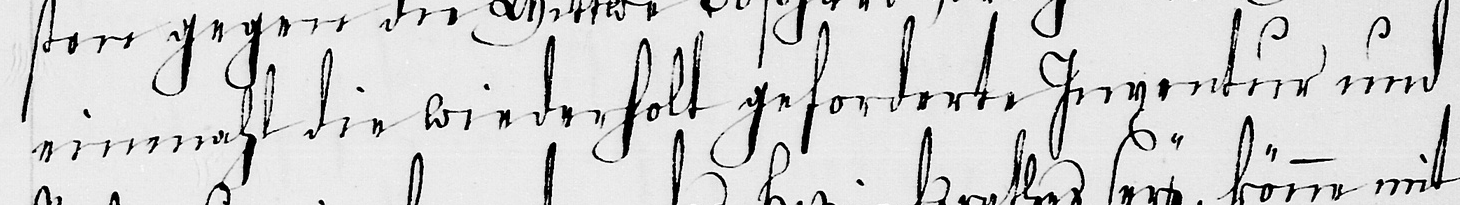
einmahl die wiederholt geforderte Inventur und
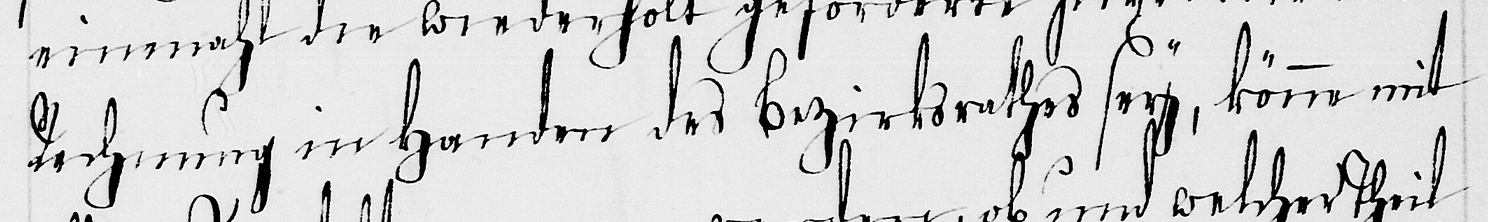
Rechnung in Handen des Bezirksrathes sey, könne mit
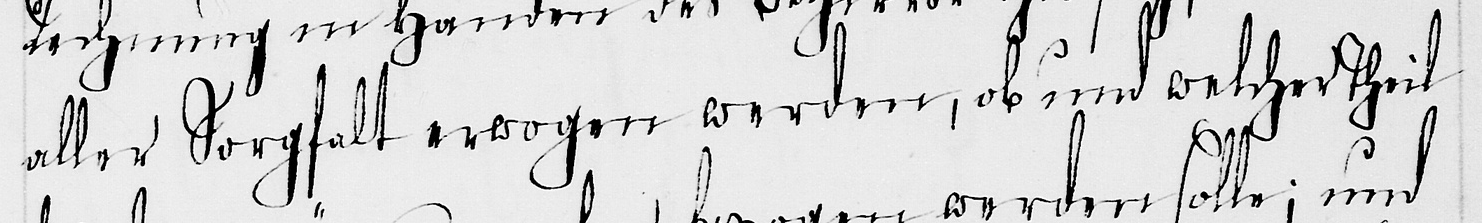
aller Sorgfalt erwogen werden, ob und welcher Theil
